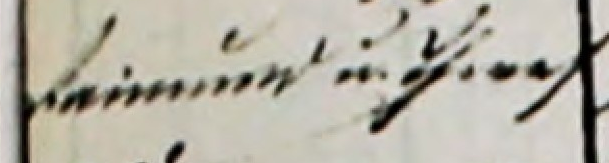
Feimund u. Theres
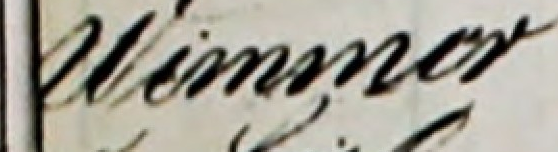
Wimmer
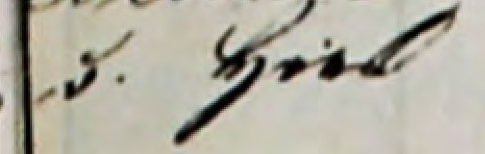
v. Hees
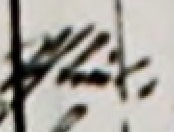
Pflinds„
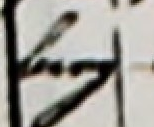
berg
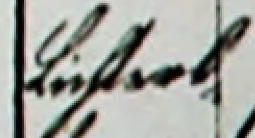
Lichters
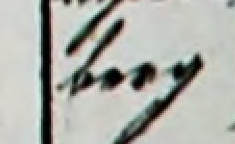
berg
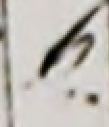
6
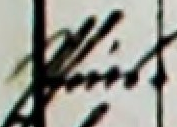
Pflinds„
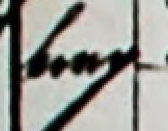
berg
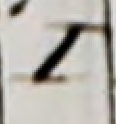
I
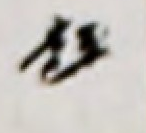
13
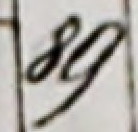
89
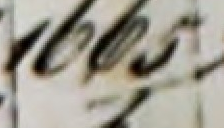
1665/b
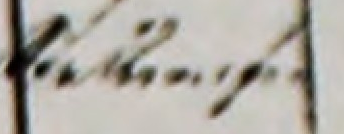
Stett???
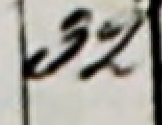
32
